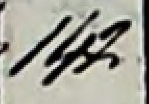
142
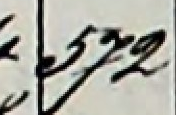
572
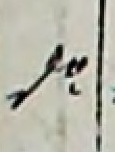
Do
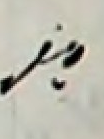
Do
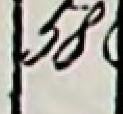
58
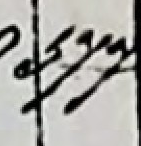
377
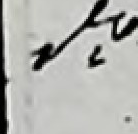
Do
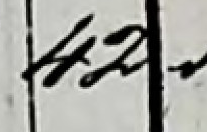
42
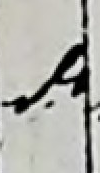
Do
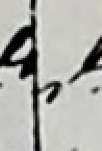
Do
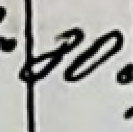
80
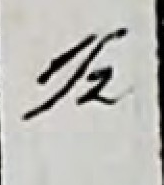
1/2
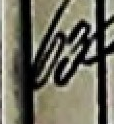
63
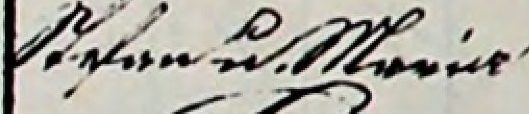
Stefan u. Maria
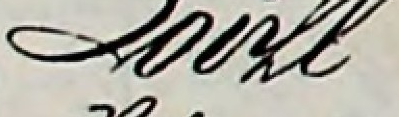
Loizl
